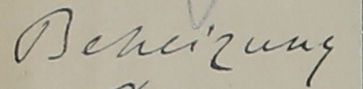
Beheizung
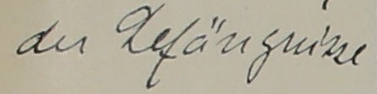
der Gefängnisse
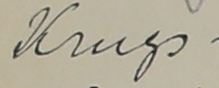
Krugs
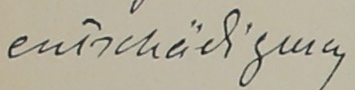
entschädigung
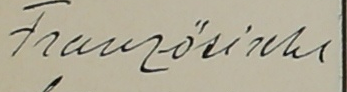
Französische
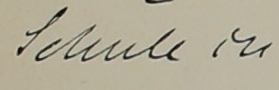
Schule in
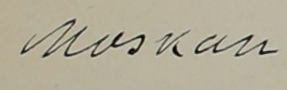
Moskau
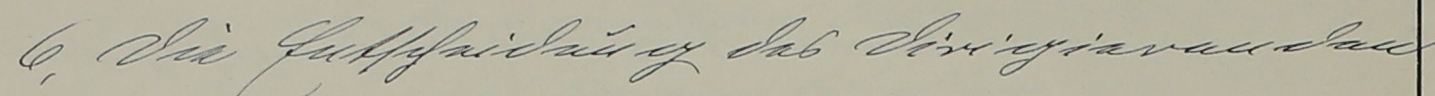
6. Die Entscheidung des Dirigierenden
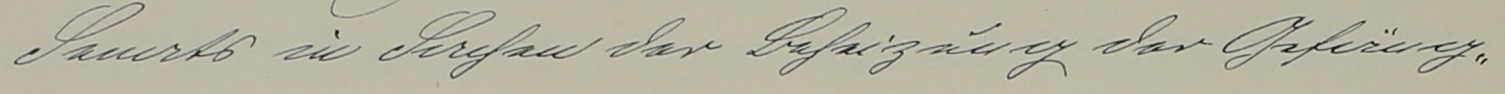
Senats in Sachen der Beheizung der Gefäng-
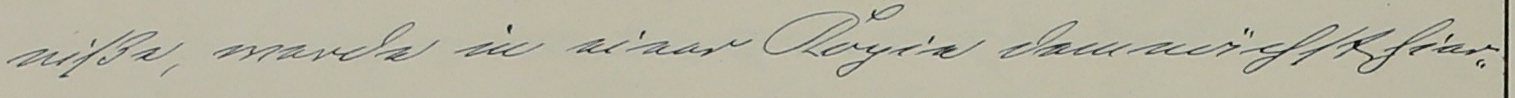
niße, werde in einer Kopie demnächst hier-
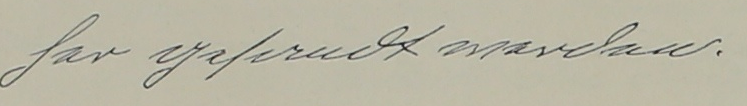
her gesandt werden.
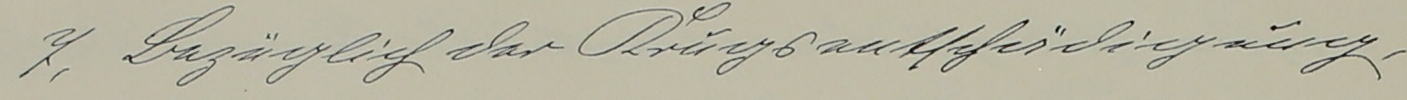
7. Bezüglich der Krugsentschädigung
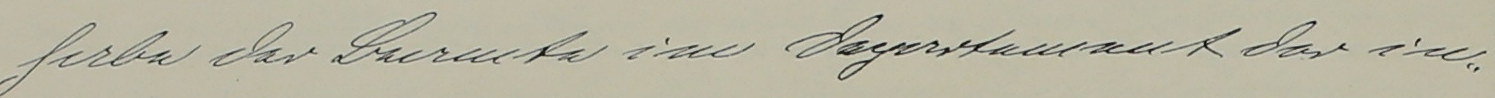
habe der Beamte im Departement der in-
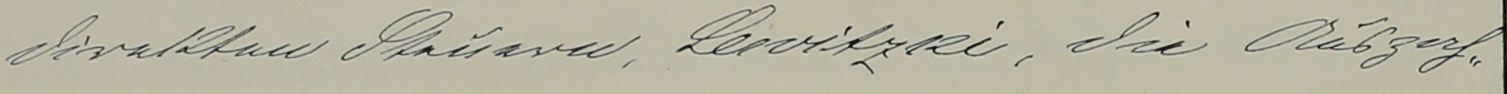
direkten Steuern, Lewitzki, die Auszah-
